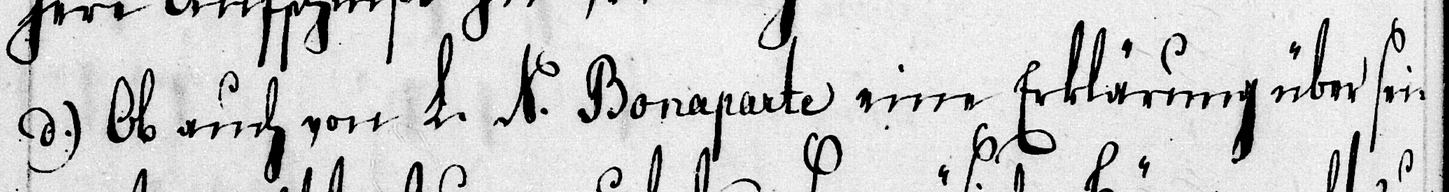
d.) Ob auch von L. N. Bonaparte eine Erklärung über se¬
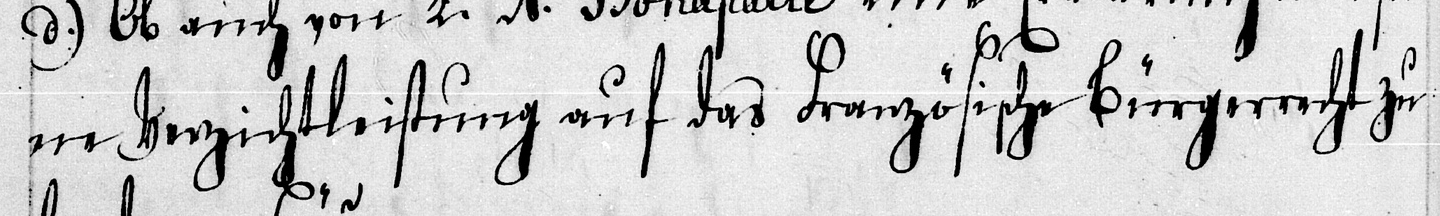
ine Verzichtleistung auf das Französische Bürgerrecht zu
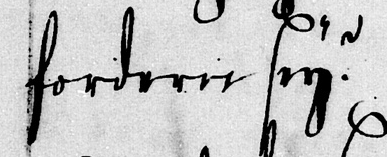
fordern sey?
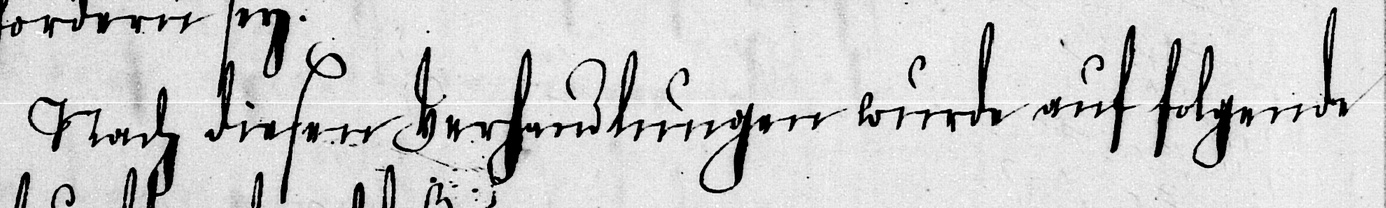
Nach diesen Verhandlungen wurde auf folgende
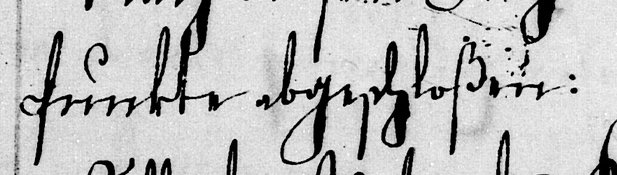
Punkte abgeschloßen:
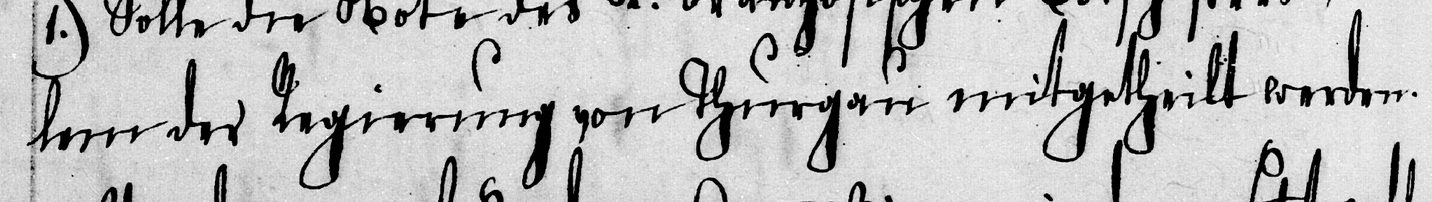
lem der Regierung von Thurgau mitgetheilt werden.
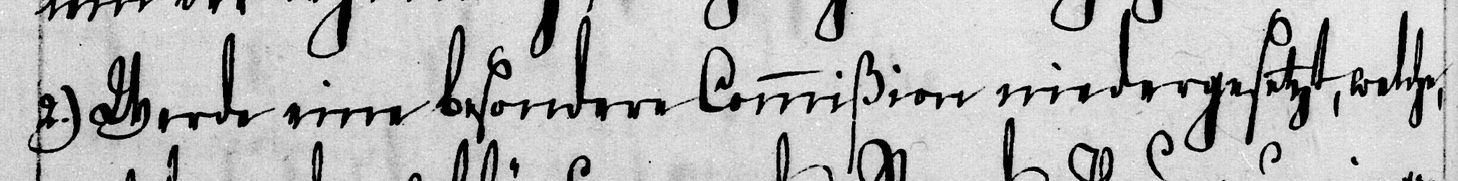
2.) Werde eine besondere Commißion niedergesetzt, welc¬
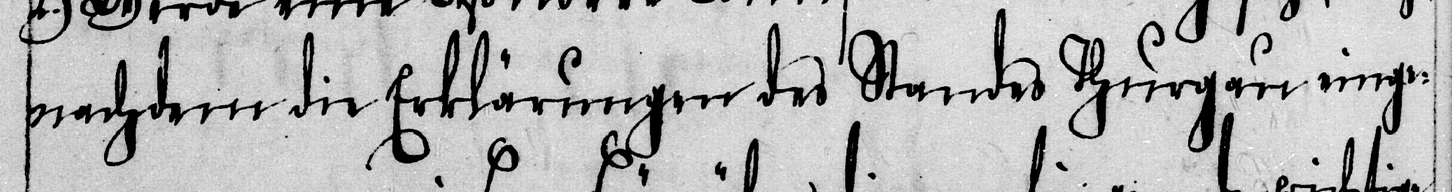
nachdem die Erklärungen des Standes Thurgau einge¬
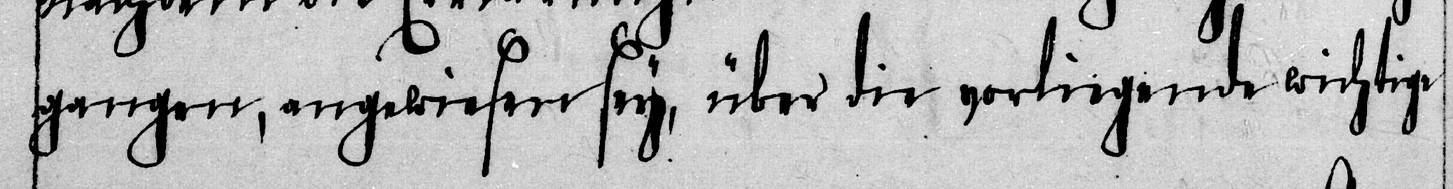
gangen, angewiesen sey, über die vorliegende wichtige
